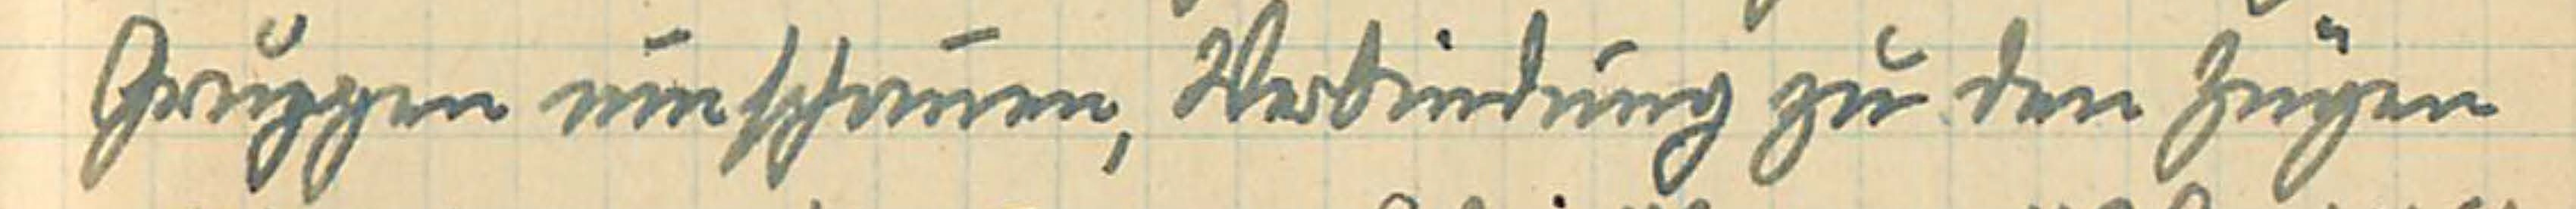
Truppen umschauen, Verbindung zu den Zügen
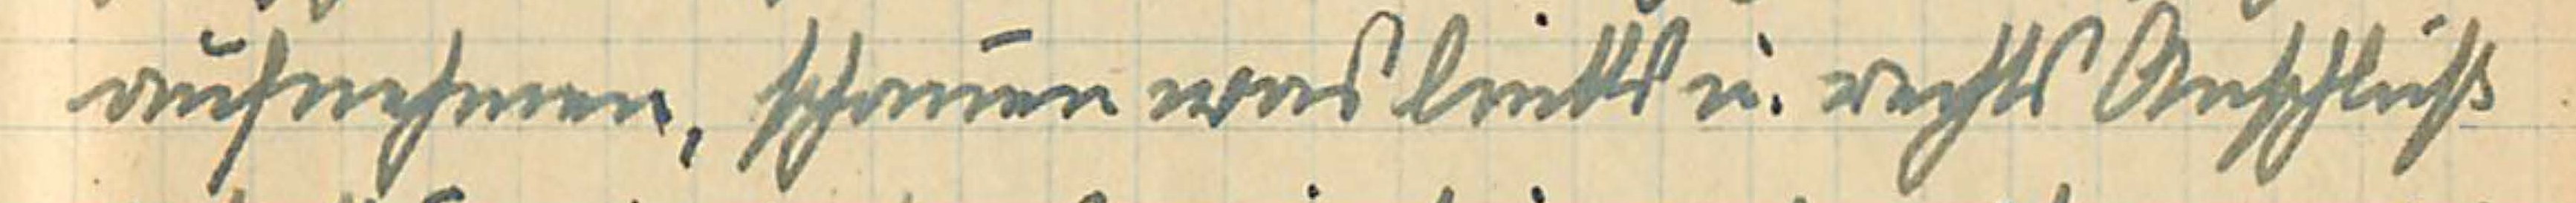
aufnehmen, schauen was links u. rechts Anschluß
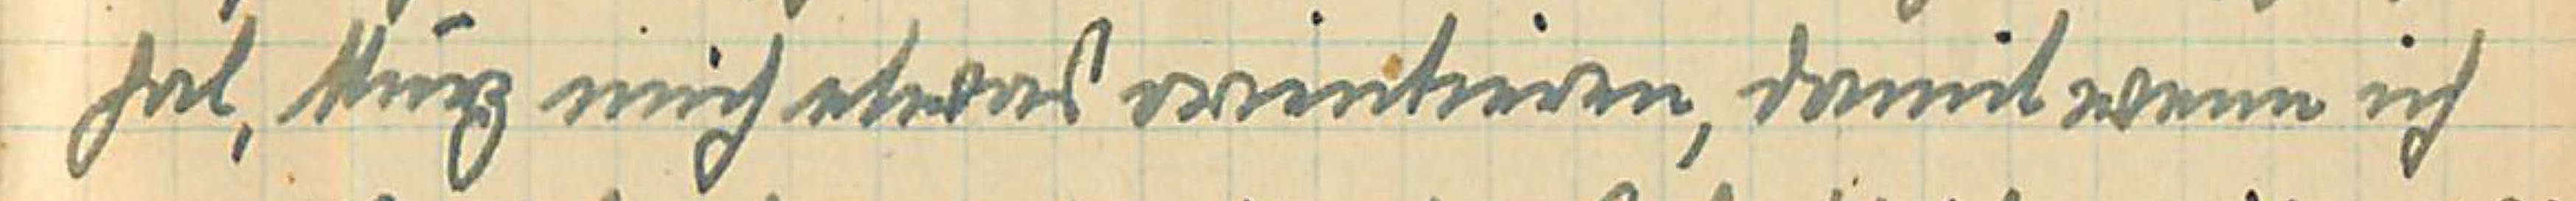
hat, kurz mich etwas orientieren, damit wenn ich
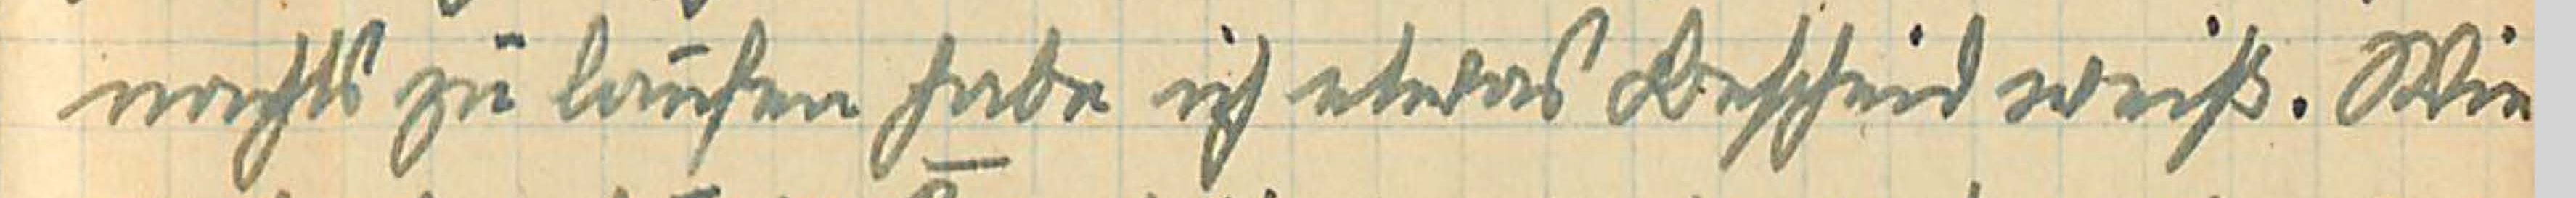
nachts zu laufen habe ich etwas Bescheid weiß. Wie
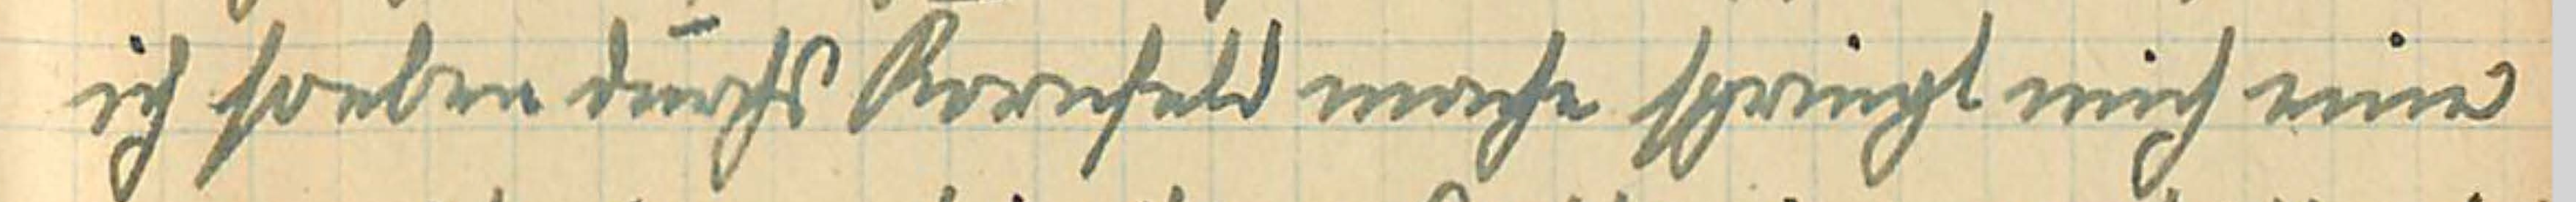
ich soeben durchs Kornfeld mache springt mich einer
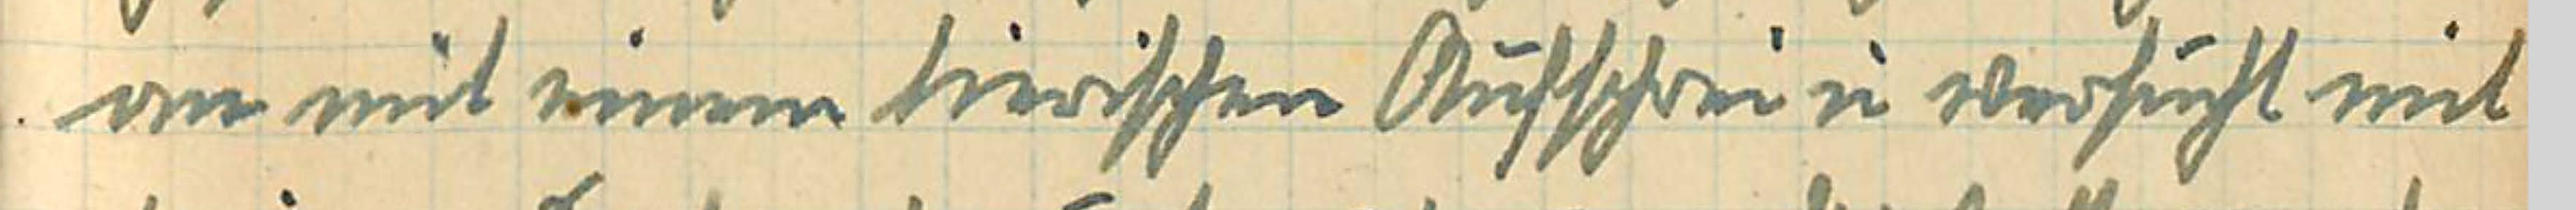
an mit einem tierischen Aufschrei u versucht mit
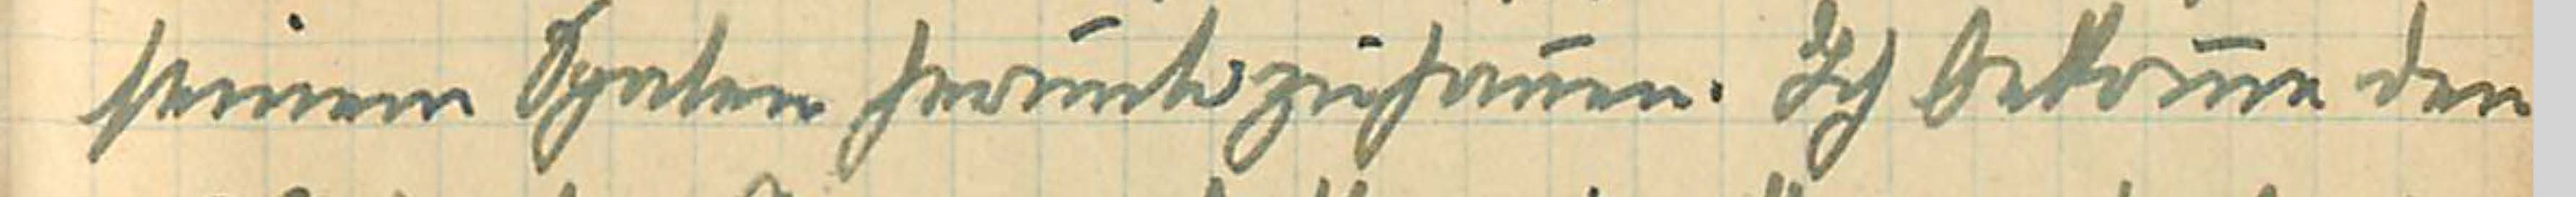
seinem Spaten herunterzuhauen. Ich bekomme den
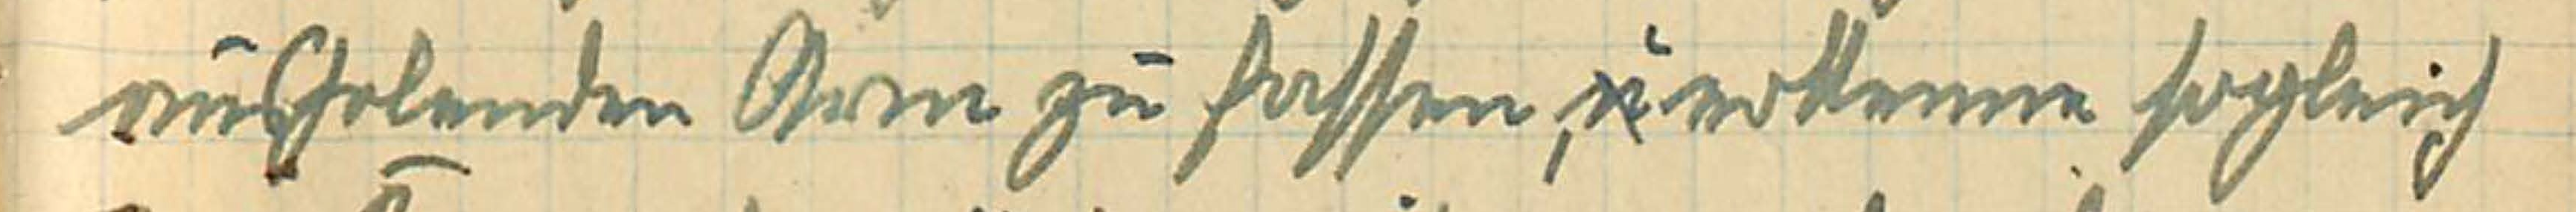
ausholenden Arm zu fassen, u erkenne sogleich
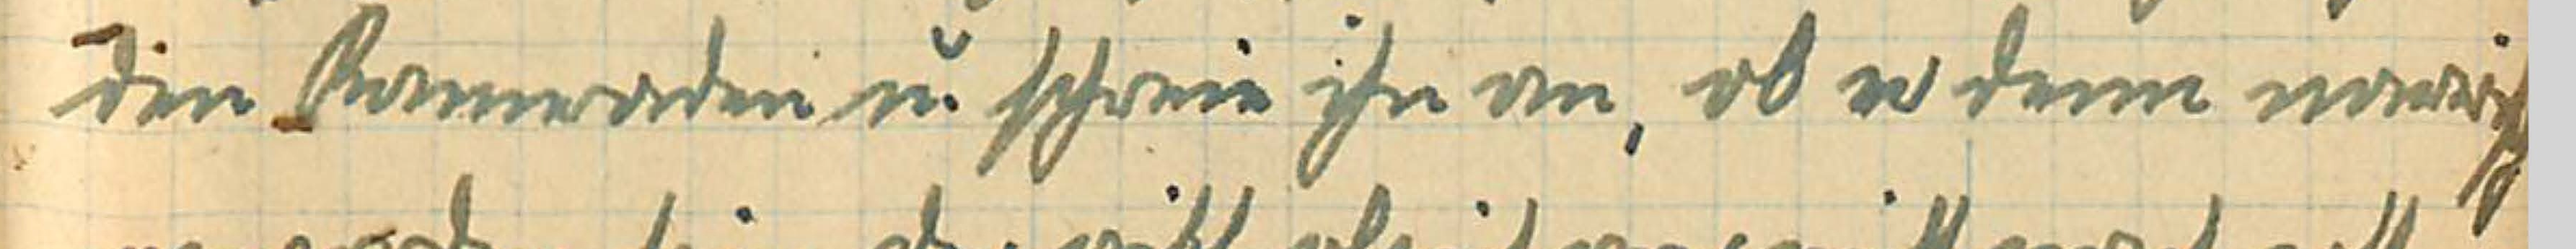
den Kameraden u. schreie ihn an, ob er denn narrisch
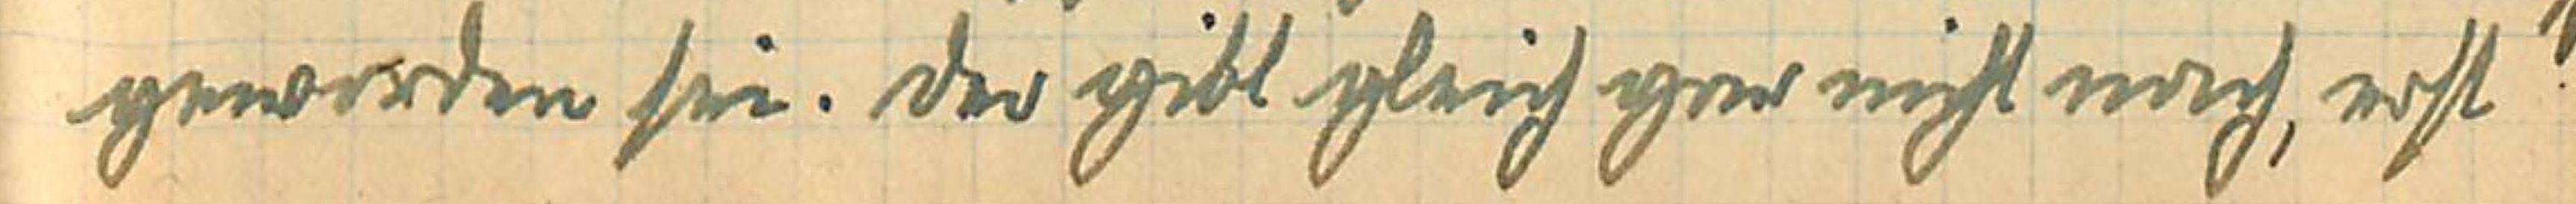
geworden sei. Der gibt gleich gar nicht nach, erst
